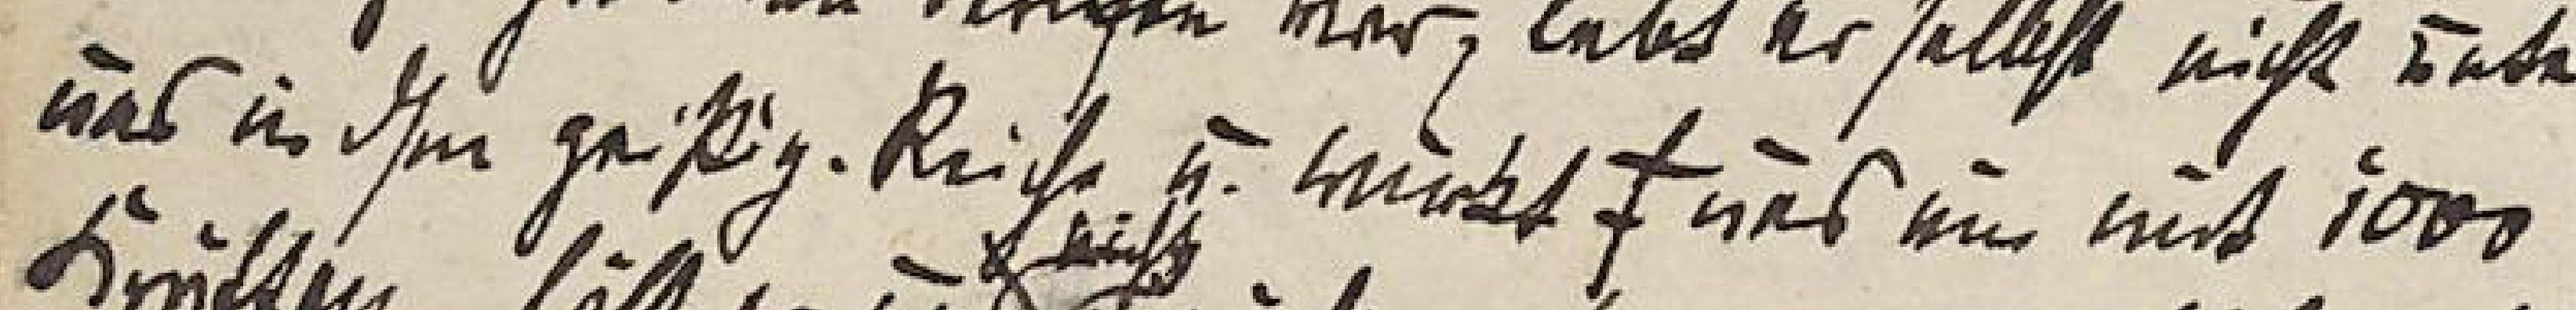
uns in dsm geistig. Reiche u. wirkt f uns ein mit 1000
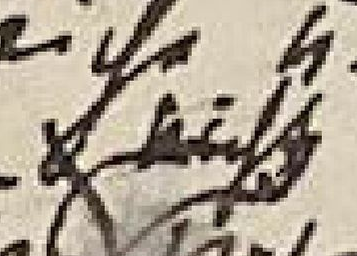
nicht
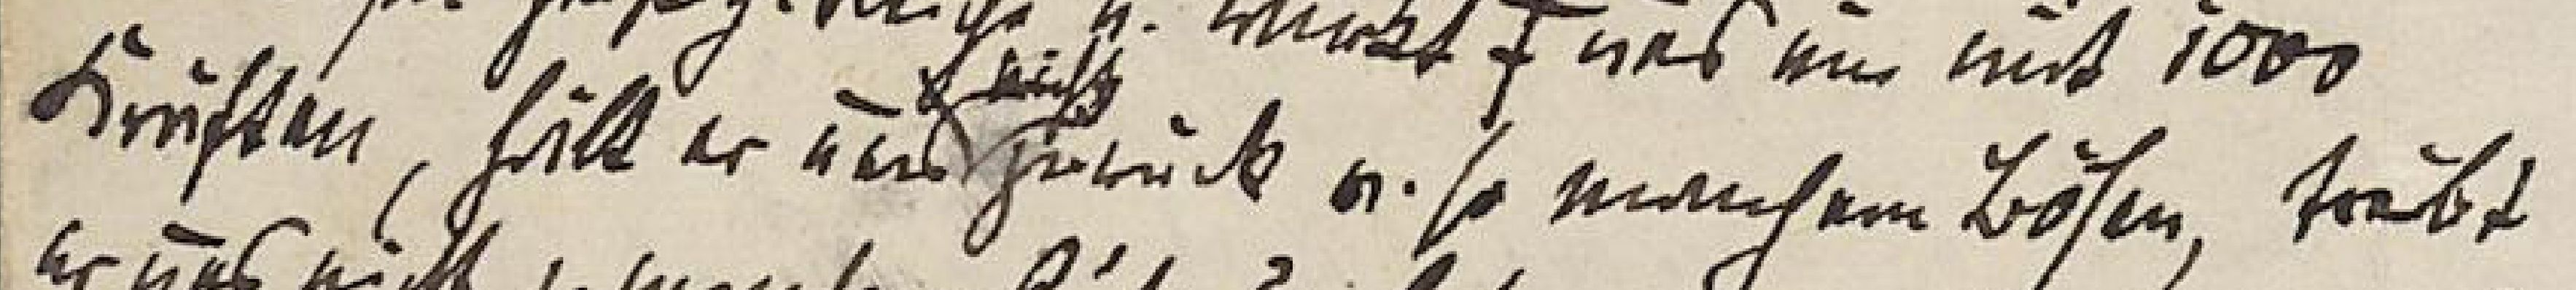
Kräften, hält er uns zurück v. so manchem Bösen, treibt
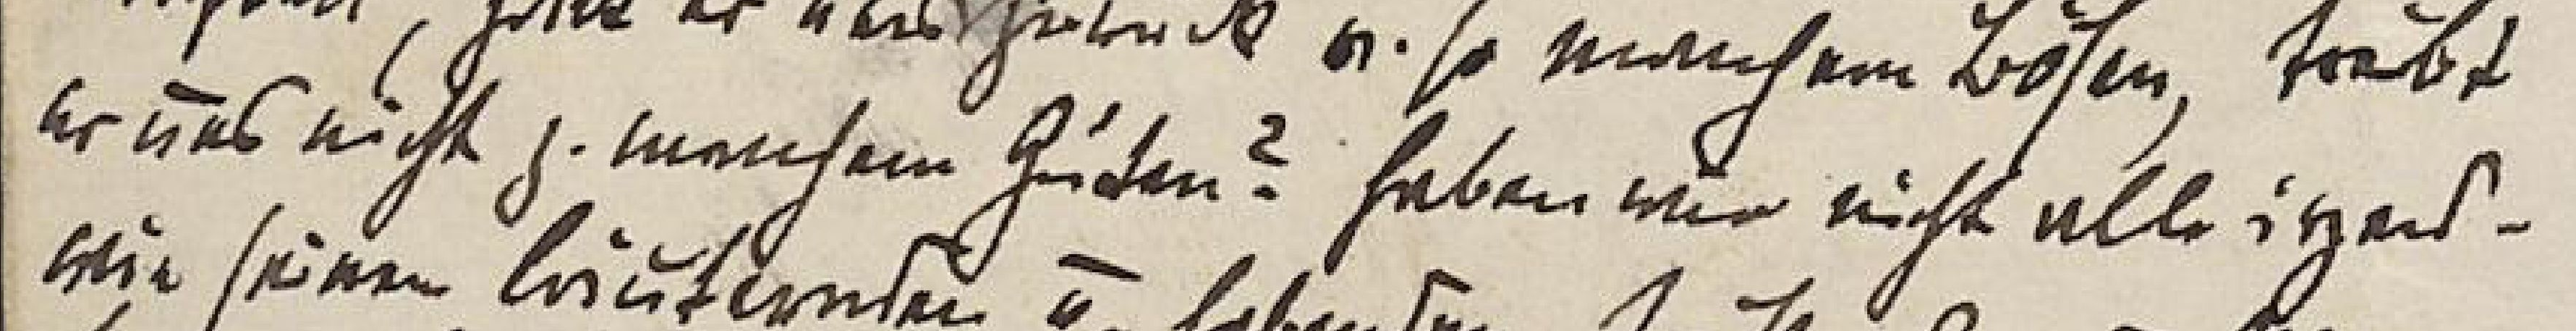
er uns nicht z. manchem Guten? Haben wir nicht alle irgend¬
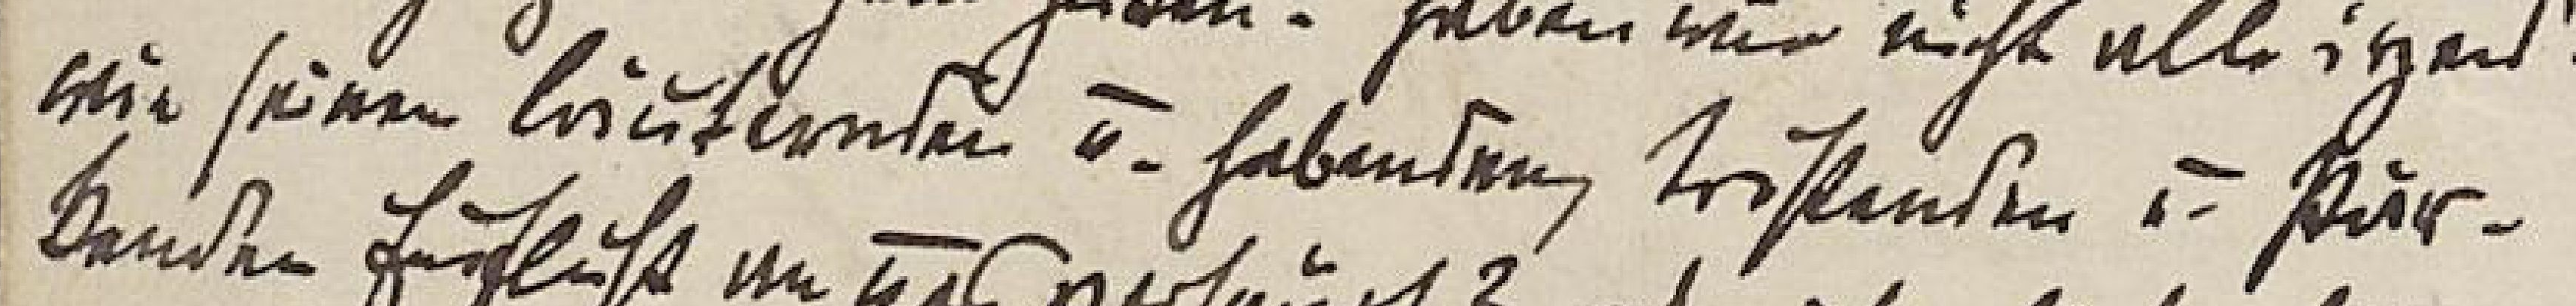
wie seinen läuternden u hebenden, tröstenden u. stär¬
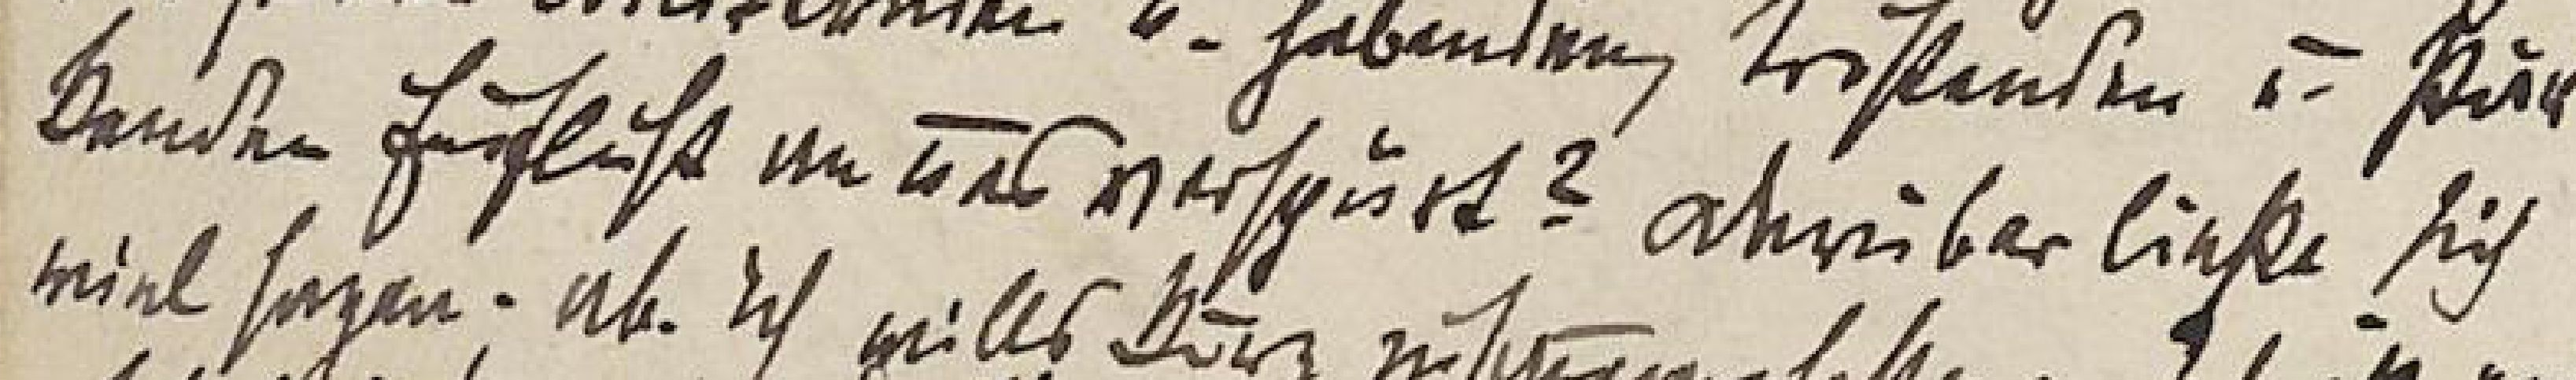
kenden Einfluß um uns verspürt? Darüber ließe sich
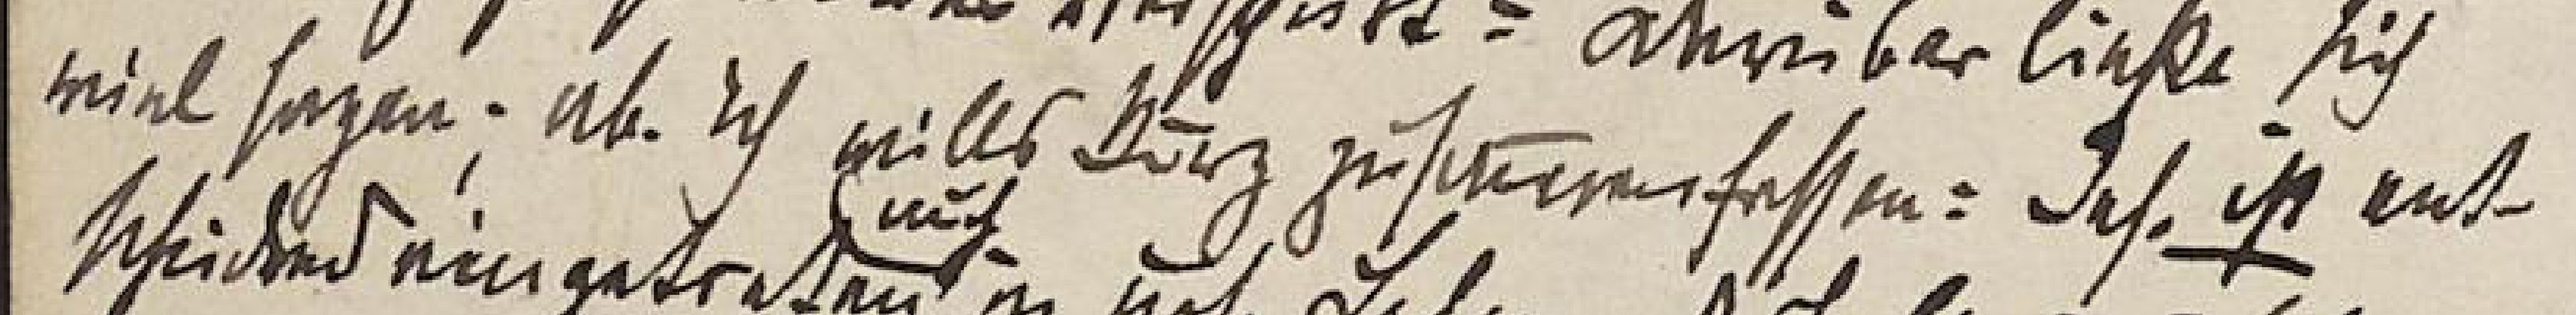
viel sagen; ab. ich wills kurz zusamenfassen: Jes. ist ent¬
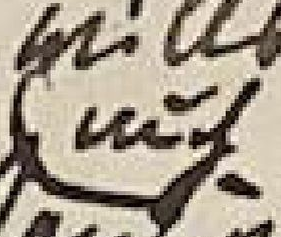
auch
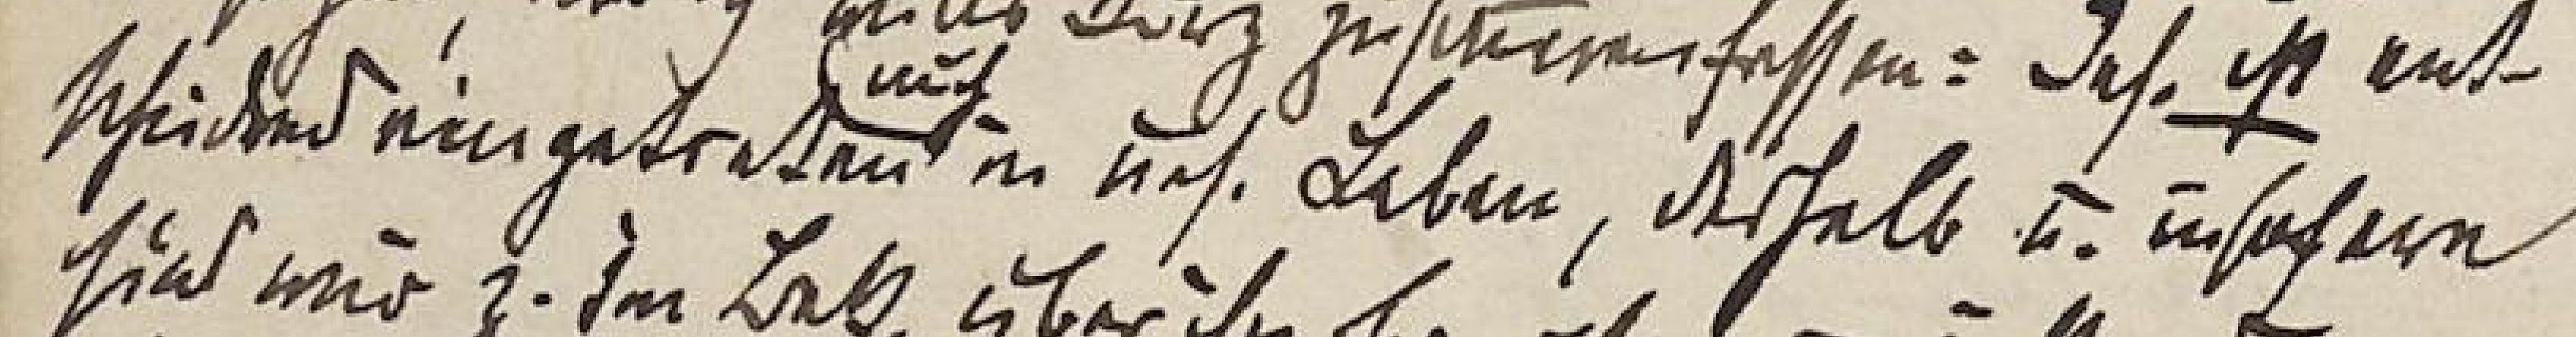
scheidend eingetreten in uns. Leben, deshalb u. insofern
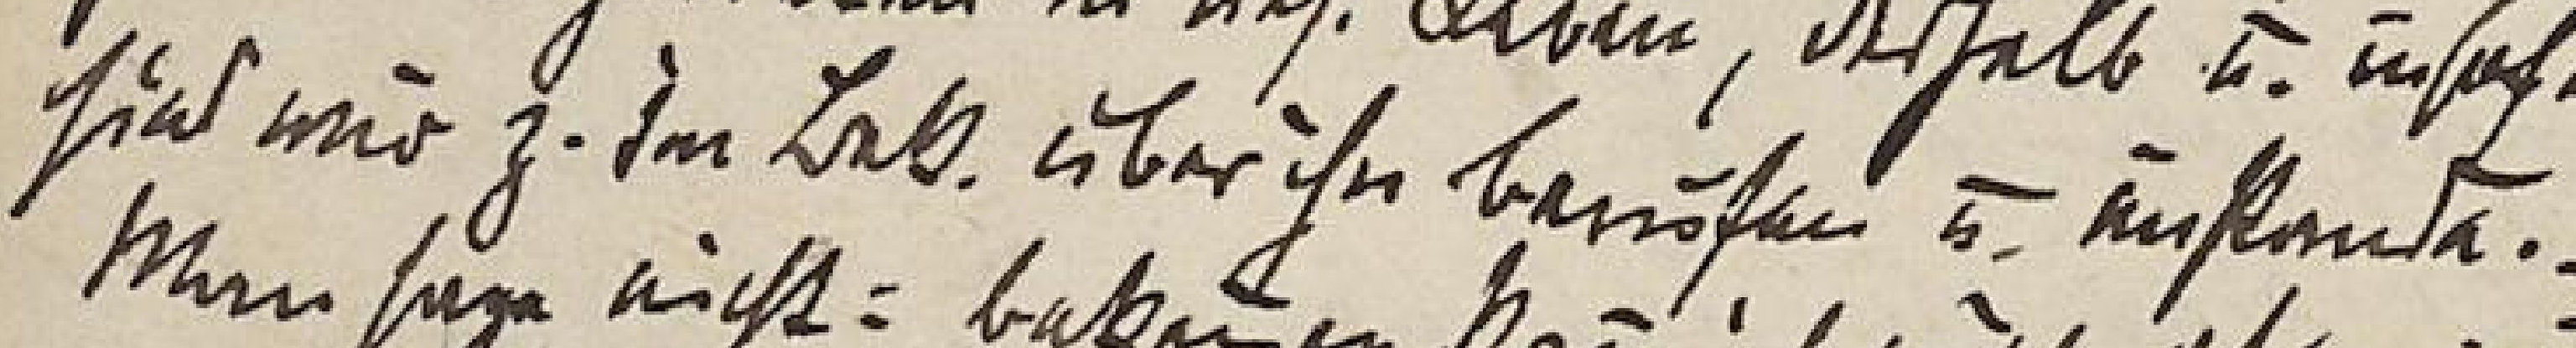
sind wir z. 1m Bek. über ihn berufen u. imstande.
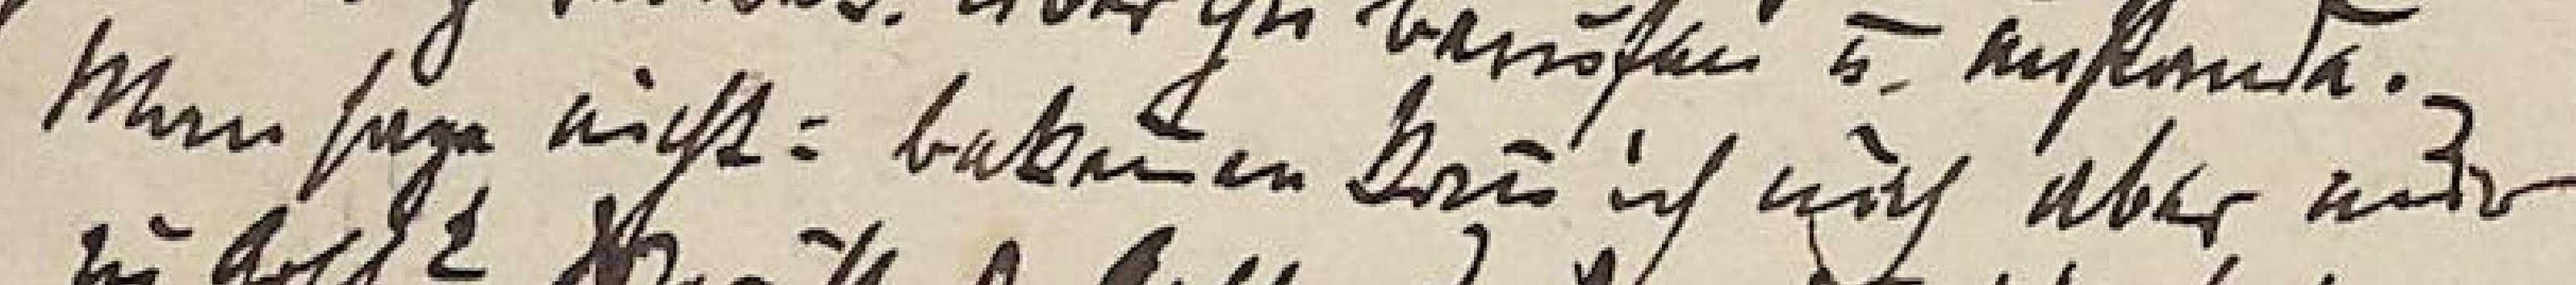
Man sage nicht: bekenen kan ich mich aber nur
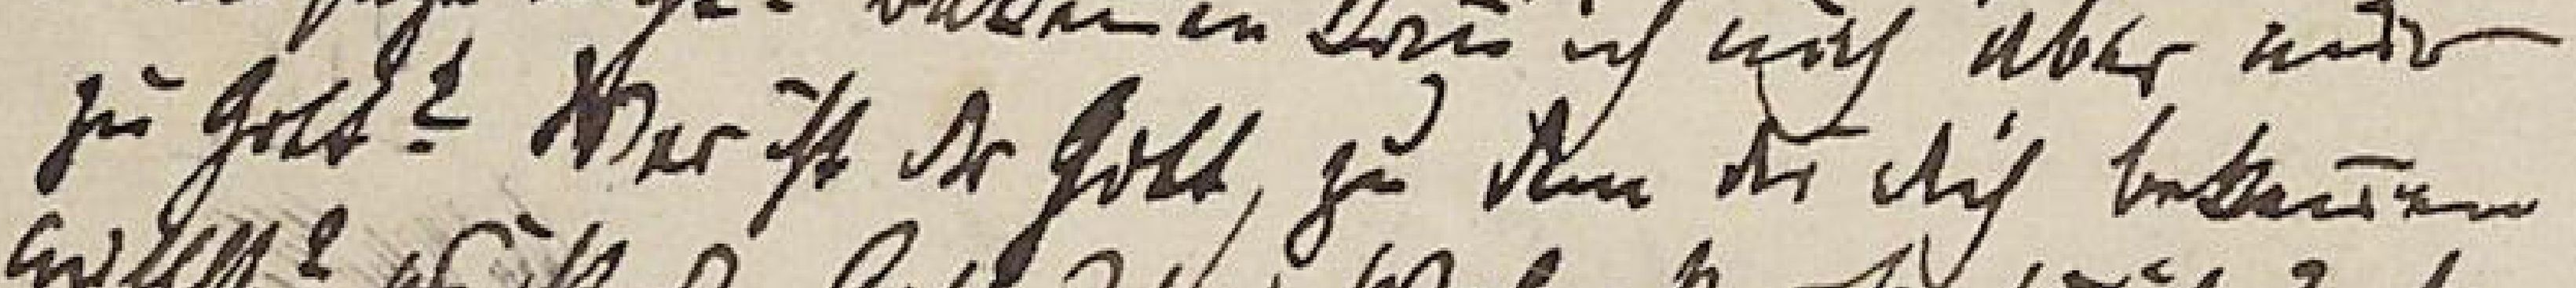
zu Gott? Wer ist dr Gott, zu dem du dich bekenen
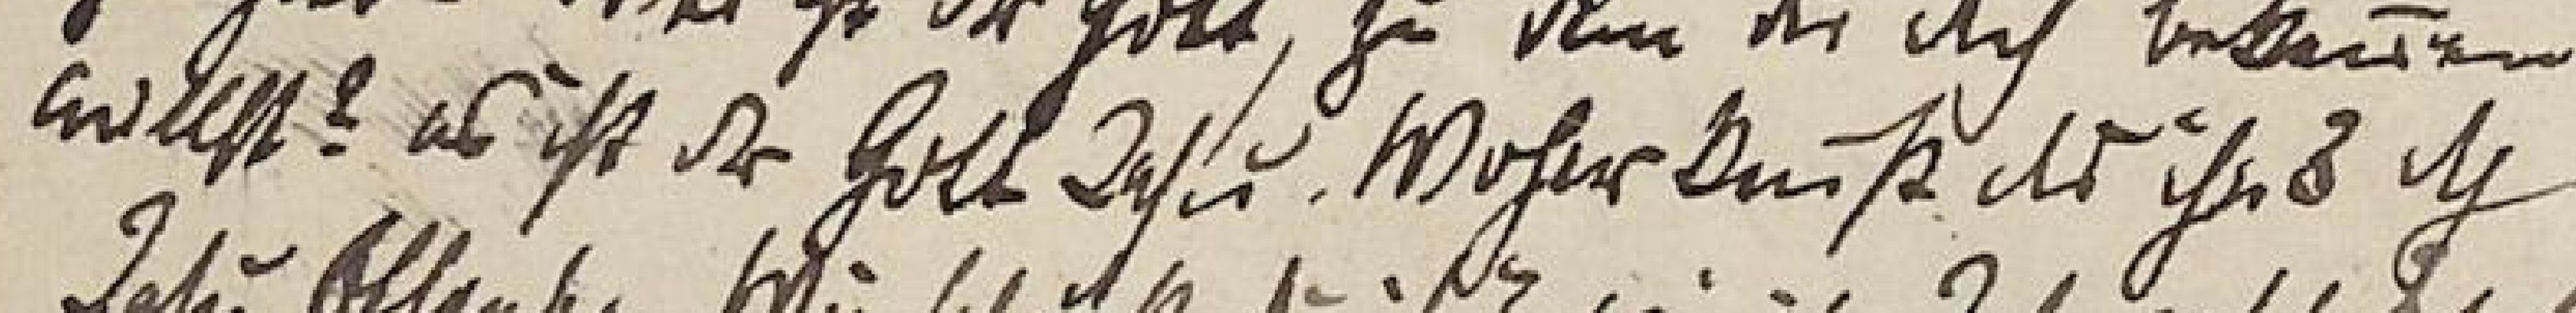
willst? es ist der Gott Jesu. Woher kenst du ihn? Dch
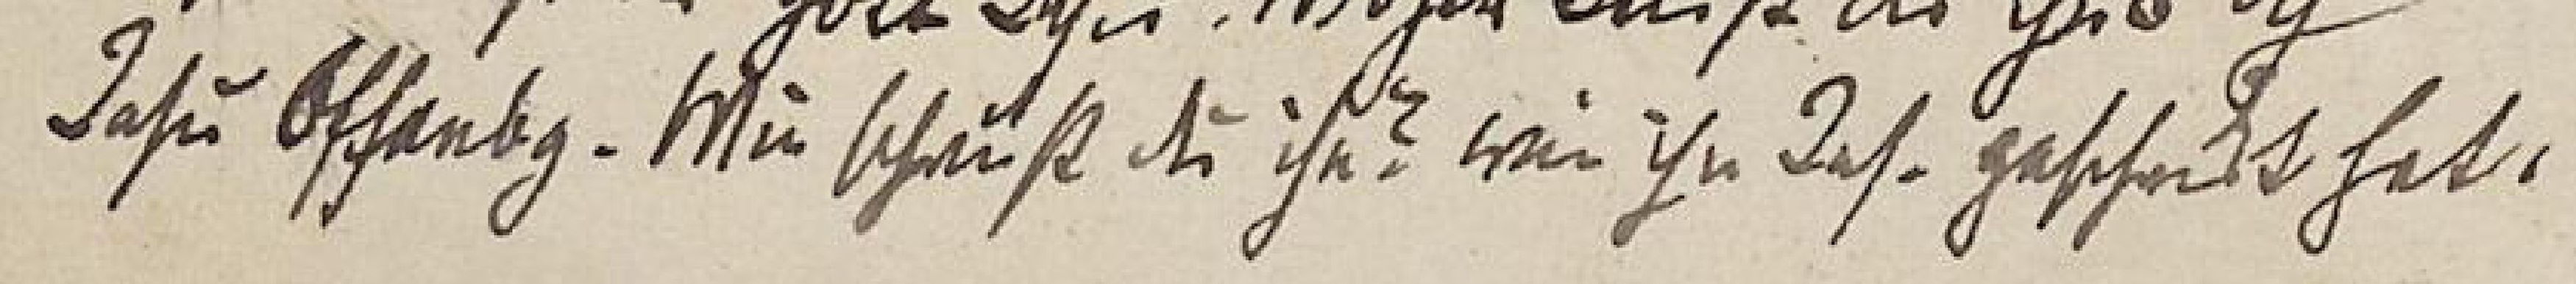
Jesu Offenbg. Wie schaust du ihn? wie ihn Jes. schaut hat.
